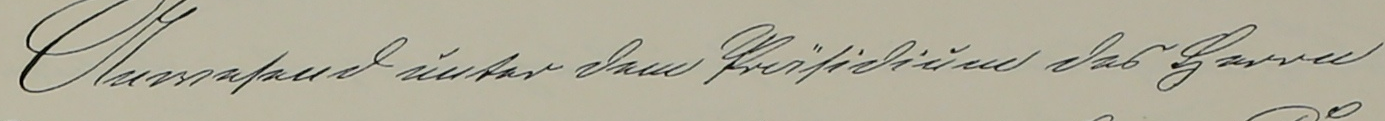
Anwesend unter dem Präsidium des Herrn
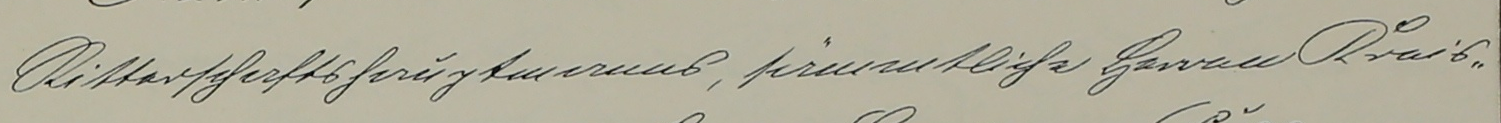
Ritterschaftshauptmanns, sämmtliche Herren Kreis-
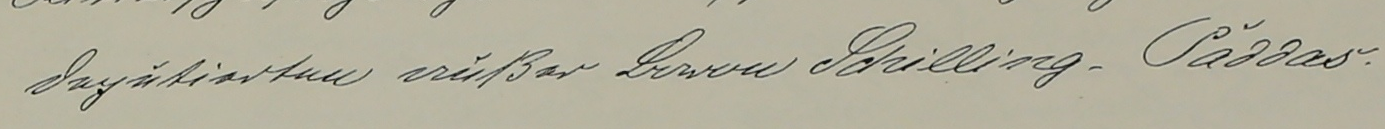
deputierten, außer Baron Schilling-Paddas.
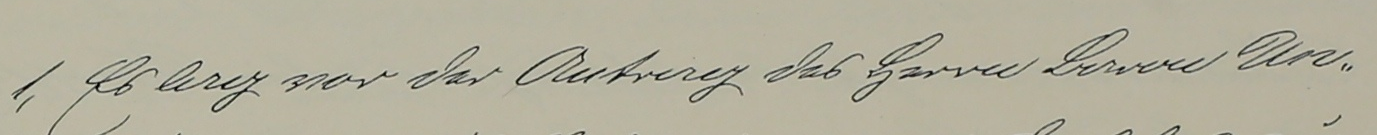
1. Es lag vor der Antrag des Herrn Baron Un-
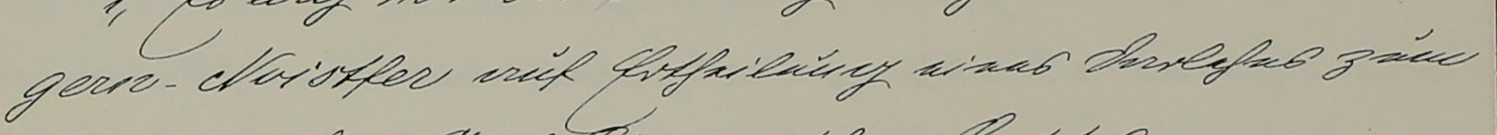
gern-Noistfer auf Ertheilung eines Darlehns zum
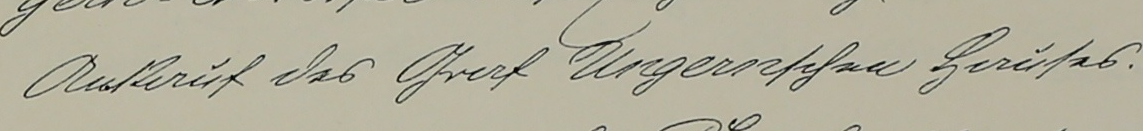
Ankauf des Graf Ungernschen Hauses.
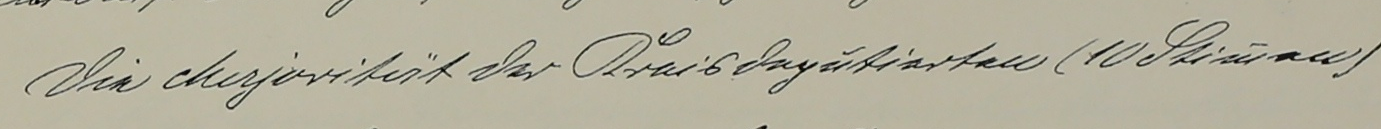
Die Majorität der Kreisdeputierten (10 Stimmen)
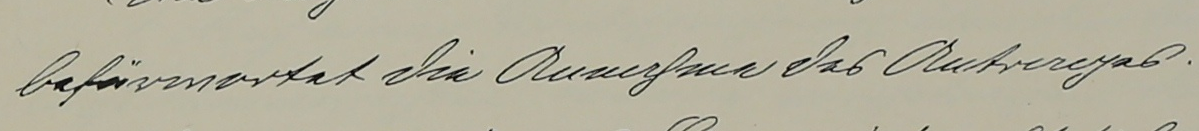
befürwortet die Annahme des Antrages.
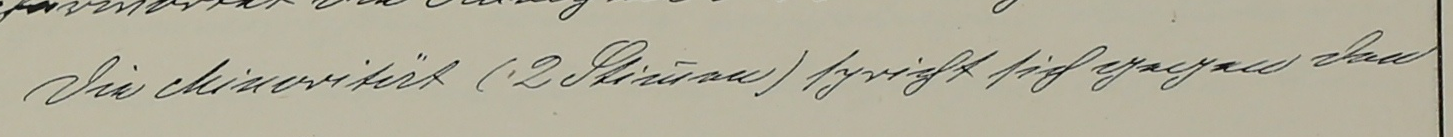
Die Minorität (2 Stimmen) spricht sich gegen den
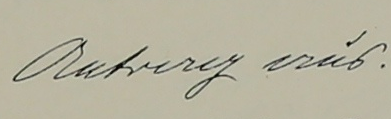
Antrag aus.
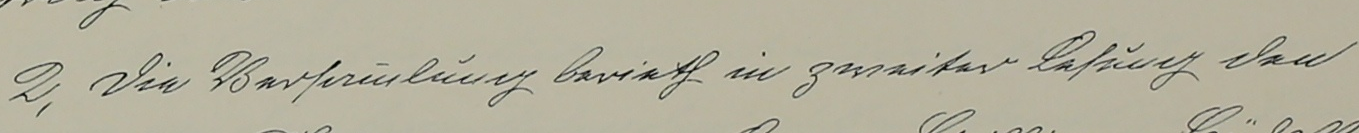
2. Die Versammlung berieth in zweiter Lesung den
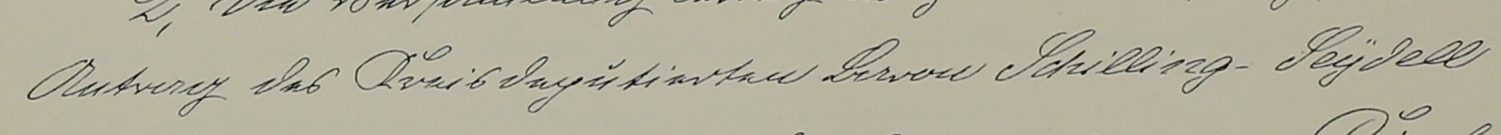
Antrag des Kreisdeputierten Baron Schilling-Seydell
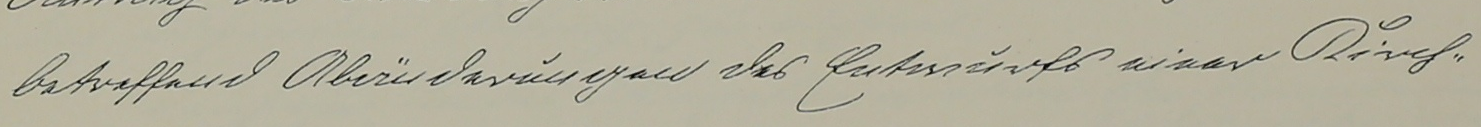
betreffend Abänderungen des Entwurfs einer Kirch-
